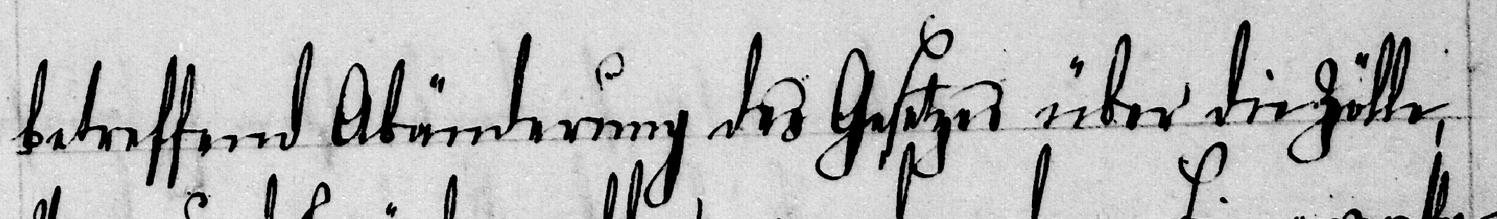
betreffend Abänderung des Gesetzes über die Zölle,
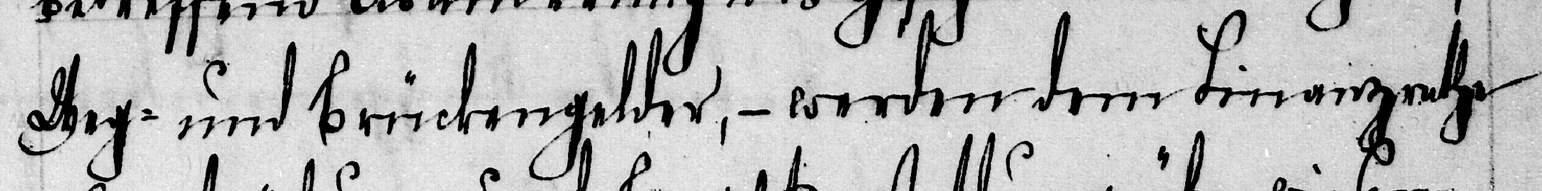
Weg- und Brückengelder, – werden dem Finanzrathe
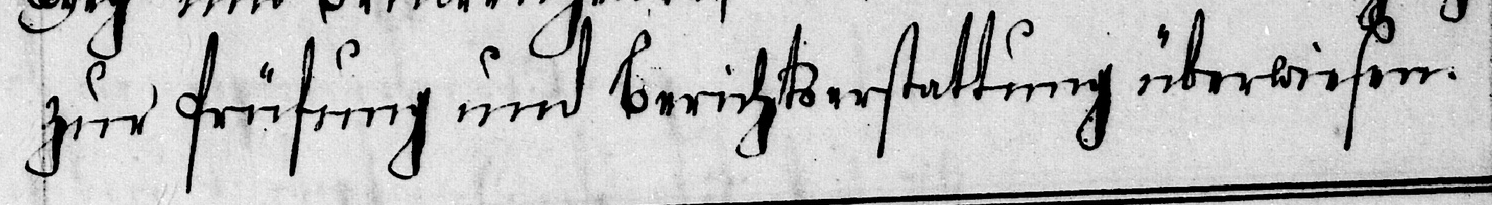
zur Prüfung und Berichtserstattung überwiesen.
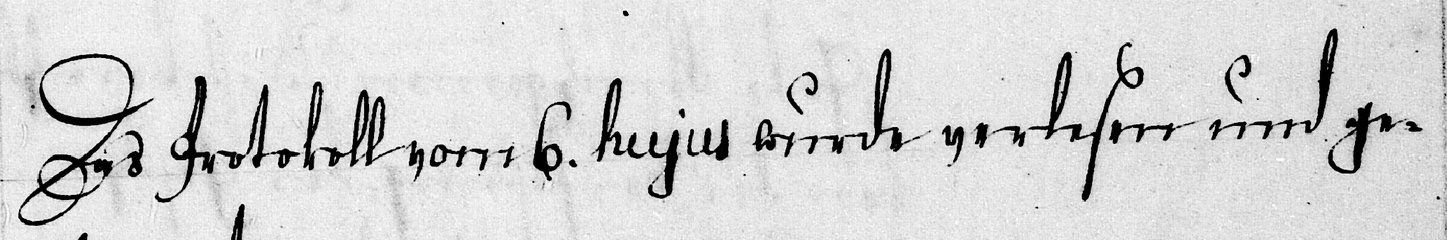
Das Protokoll vom 6. hujus wurde verlesen und ge¬
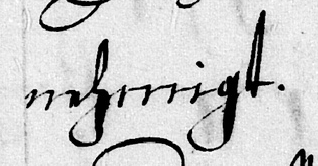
nehmigt.
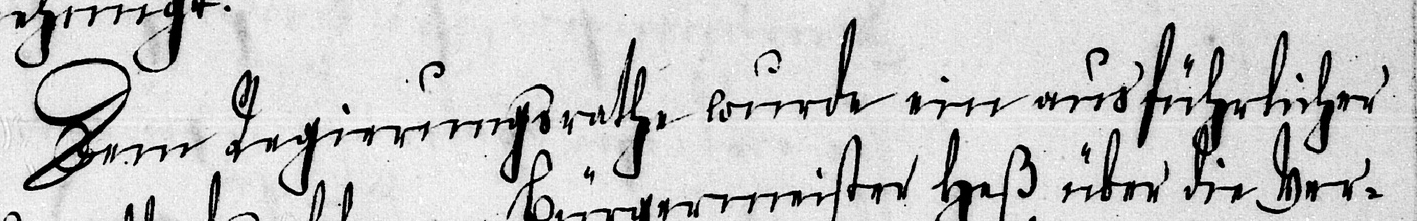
Dem Regierungsrathe wurde ein ausführlicher
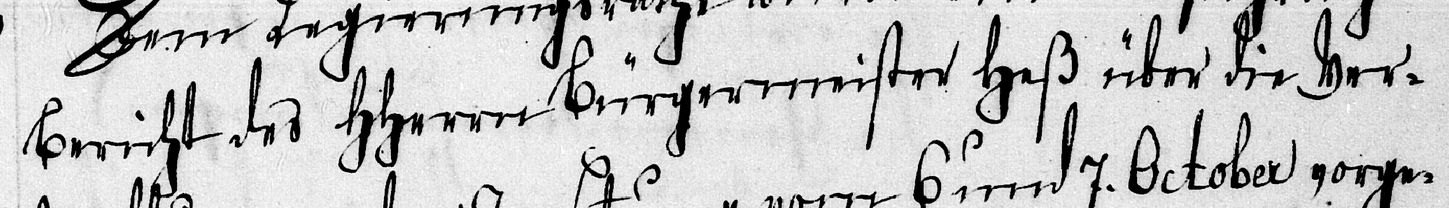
Bericht des HHerrn Bürgermeister Heß über die Ver¬
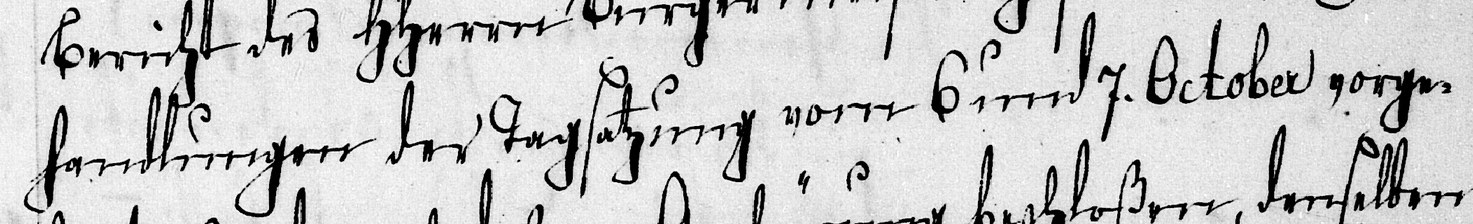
handlungen der Tagsatzung vom 6. und 7. October vorge¬
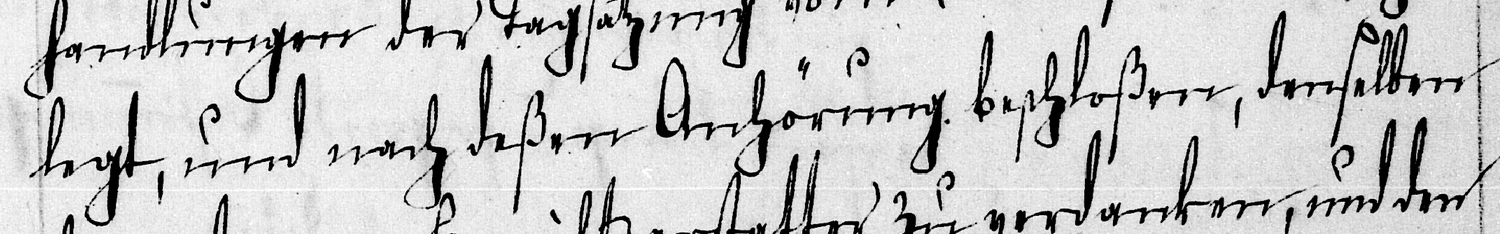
legt, und nach deßen Anhörung beschloßen, denselben
